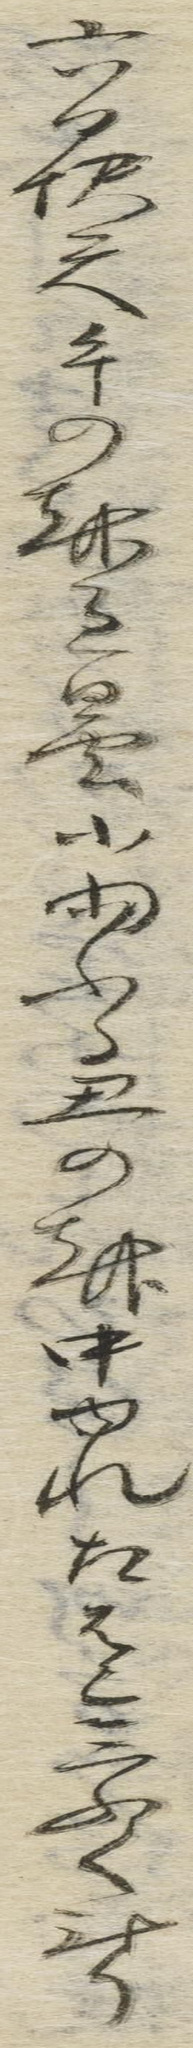六日快天午の刻過曇小雨ふる丑の刻中ゆれたはこ二ふく計り
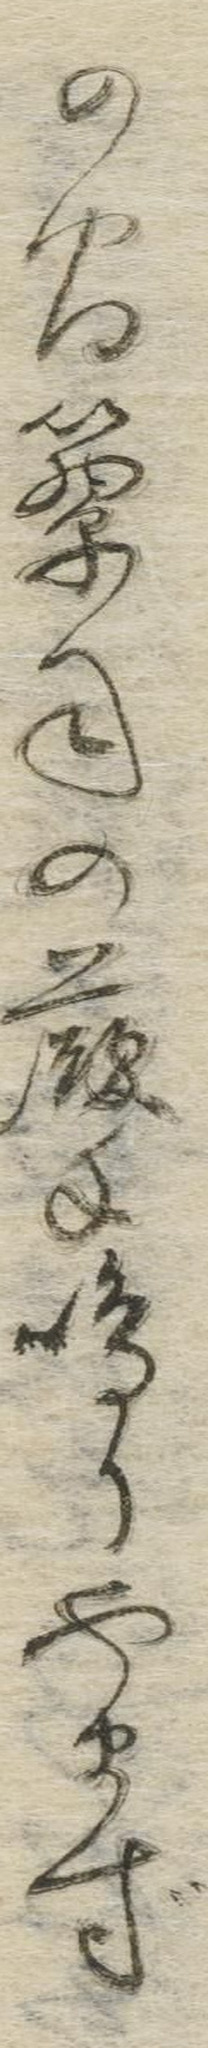の間箪笥の履手鳴りやまず
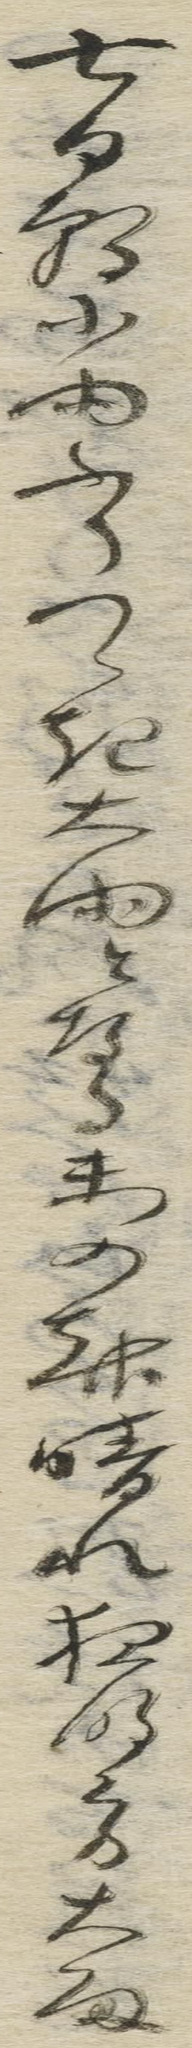七日朝小雨ふりつゝき大雨となる未の刻晴れ夜明方大雨
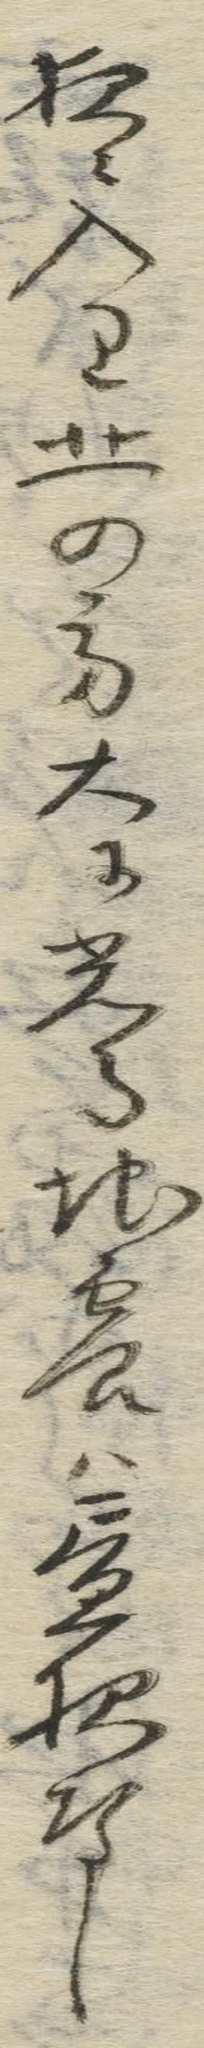夜二入り北の方大に光る地震ハ昼夜なし
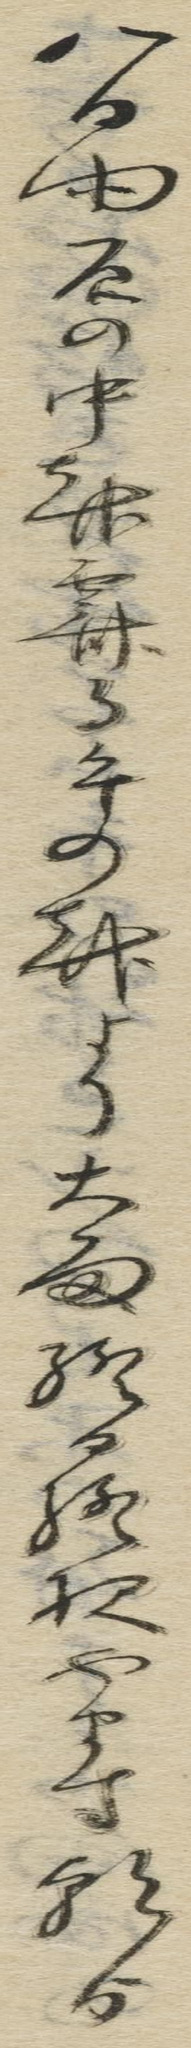八日雨辰の中刻霽る午の刻より大雨終日終夜やます朝ゟ
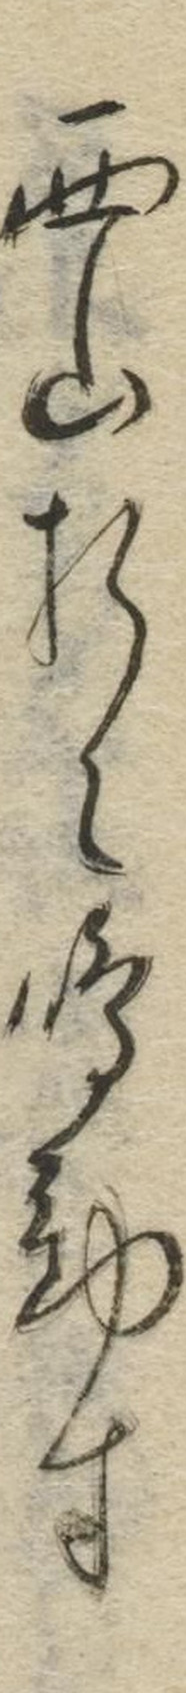西山折々鳴動す
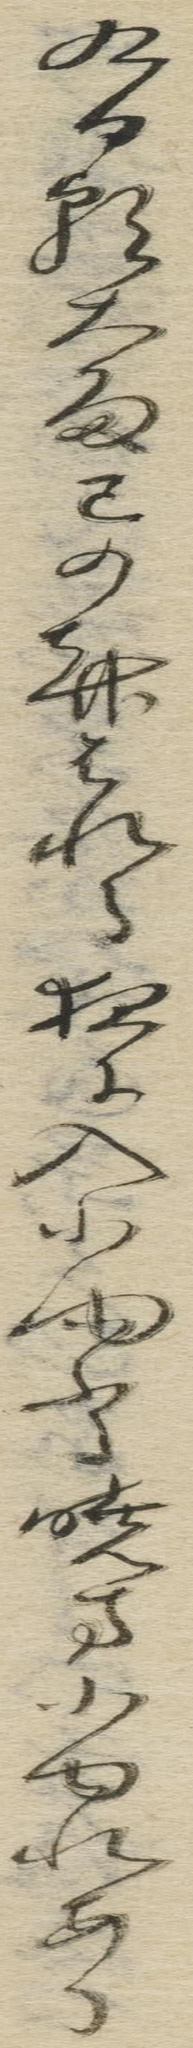九日朝大雨巳の刻はれる夜に入小雨ふる暁方小ゆれあり
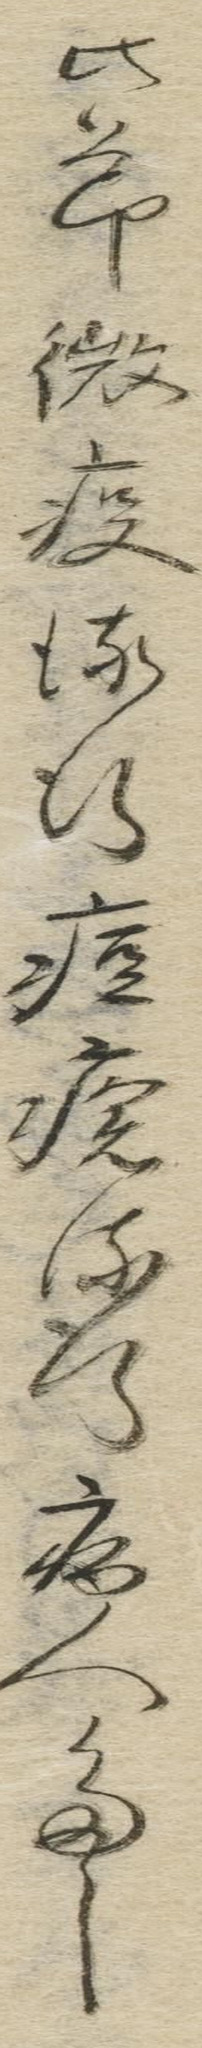此節徴疫流行痘瘡流行病人多し
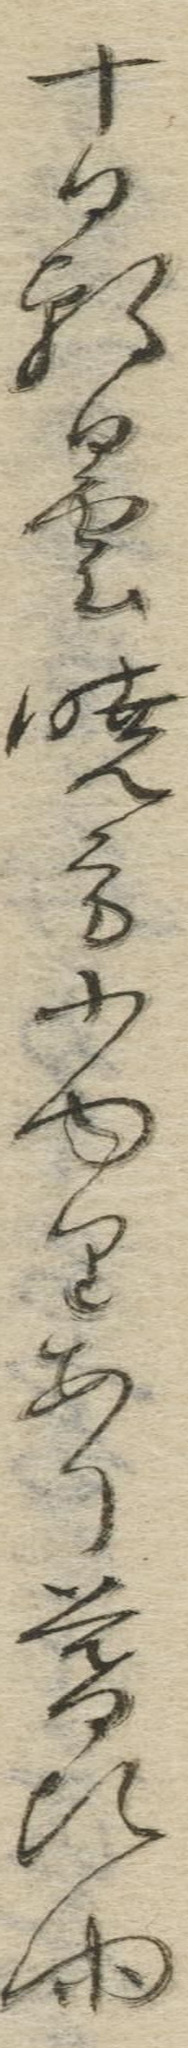十日朝曇暁方小ゆりあり暮頃雨
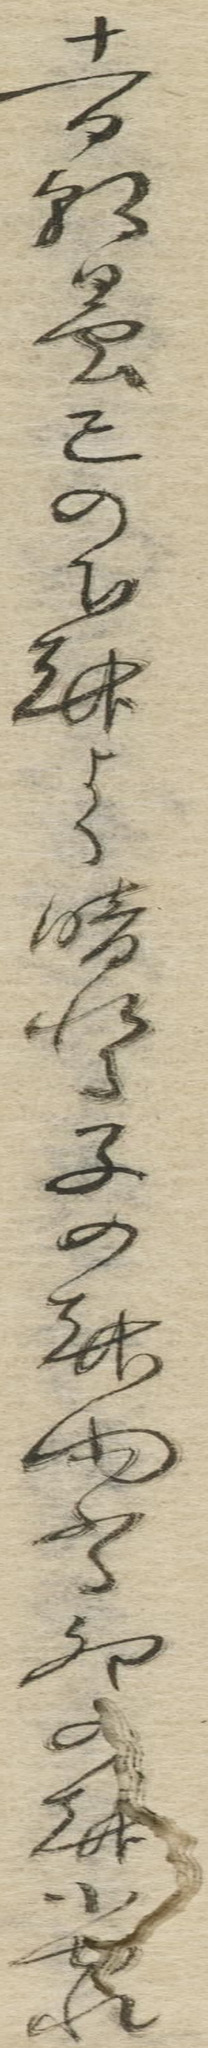十一日朝曇巳の下刻より晴れる子の刻雨ふる卯の刻小ゆれ
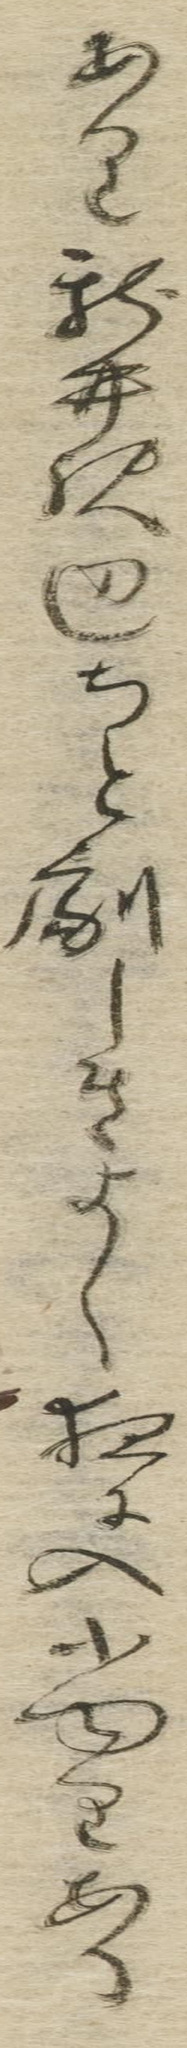あり新井駅辺ちと劇しきよし夜に入小ゆりあり
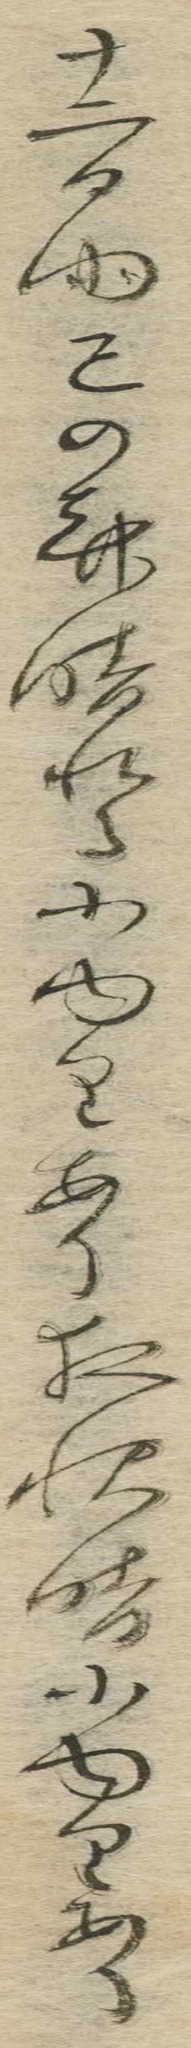十二日雨巳の刻晴れる小ゆりあり夜快晴小ゆりあり
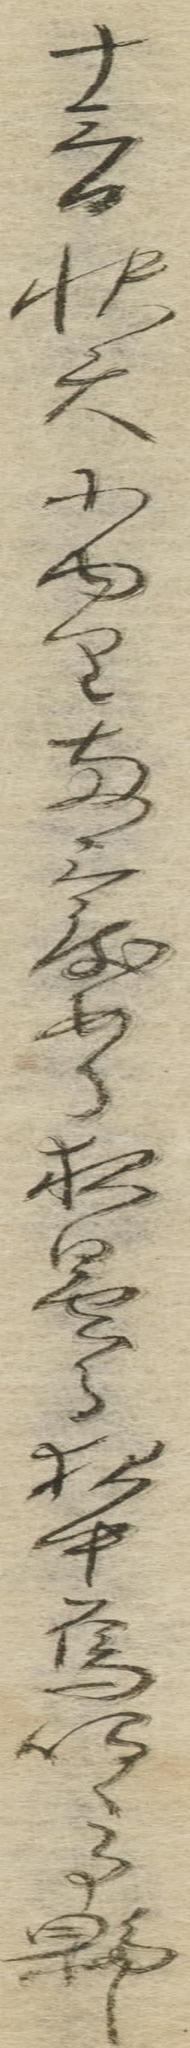十三日快天小ゆり両三度あり夜曇る夜中鳥鳴く事夥し
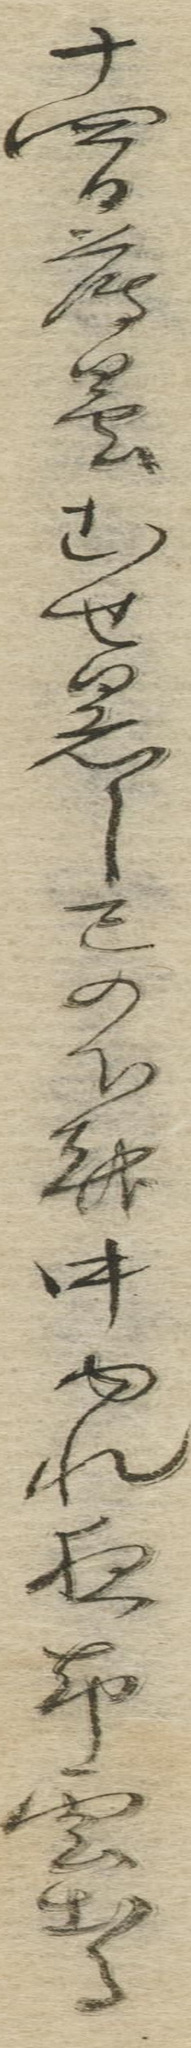十四日薄曇むせ暑し巳の下刻中ゆれ夜布雲出る

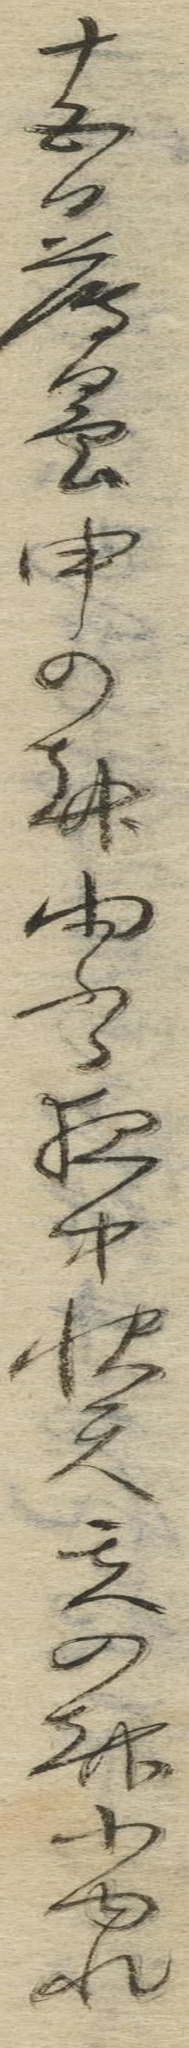十五日薄曇申の刻雨ふる夜中快天亥の刻小ゆれ
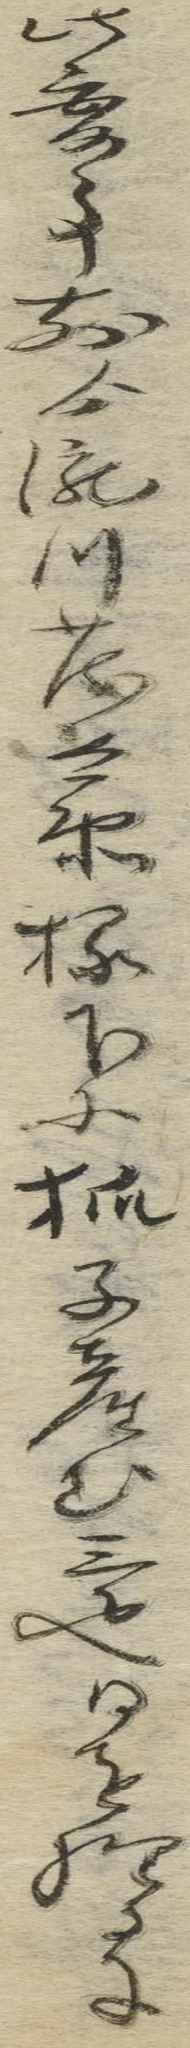此変事前ゟ滝川茂兵衛椽下に狐子産む三疋日を経るに
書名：弘化丁未天變日記
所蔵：東京大学地震研究所図書室 Earthquake Research Institute Library, The University of Tokyo, JAPAN
